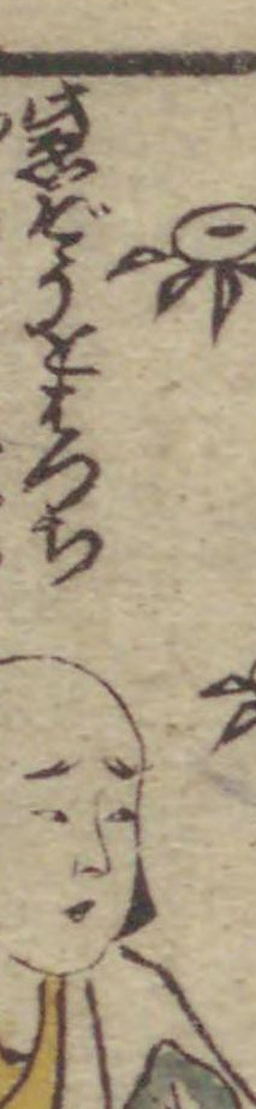此ゑぞうをはつち
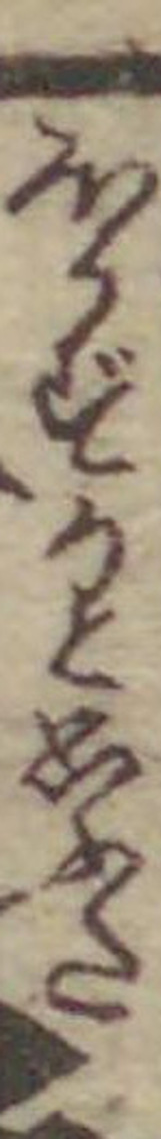ほうずかと思ふた
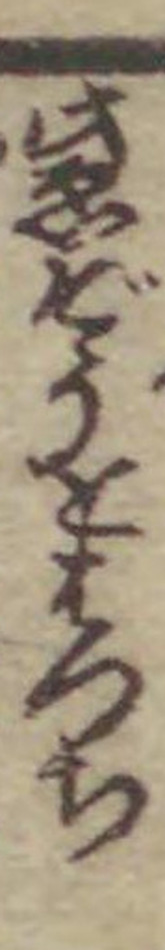此ゑぞうをはつち

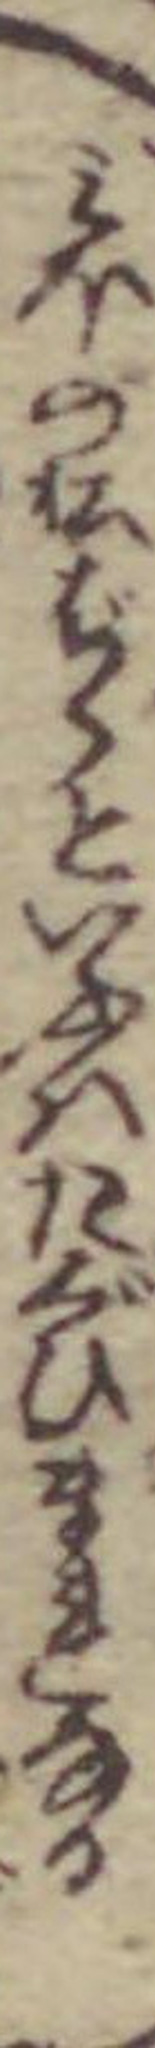みほの松ばらといふはたぐひまれなる
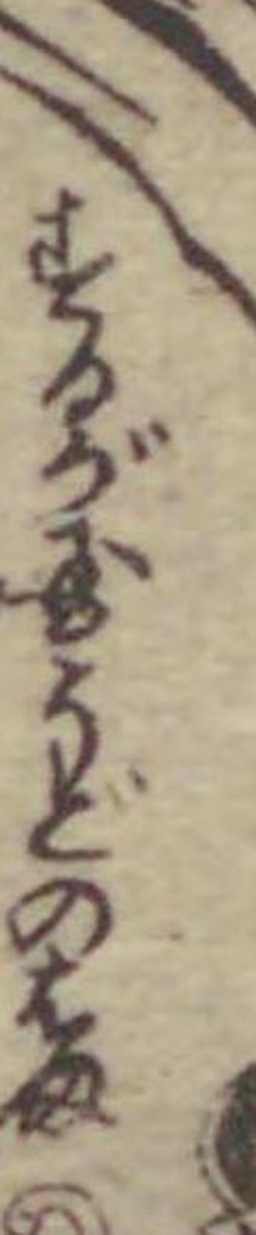するが国うどのはま
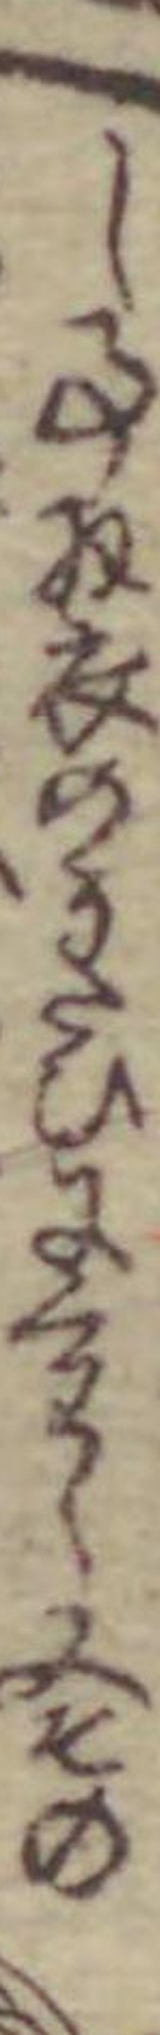し事羽衣のうたひにくわし又その
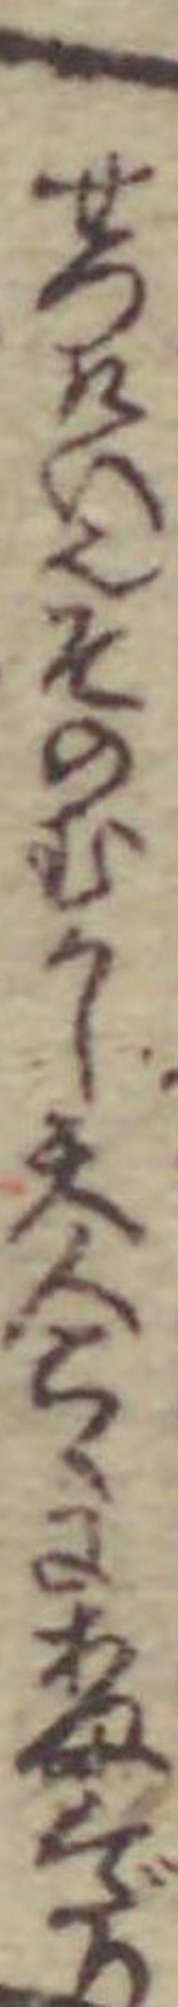せつけい也そのむかし天人こゝにあまくだり
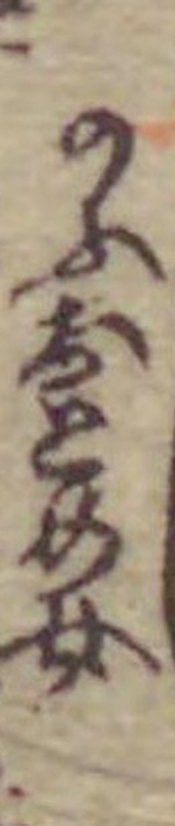のふおとめ女
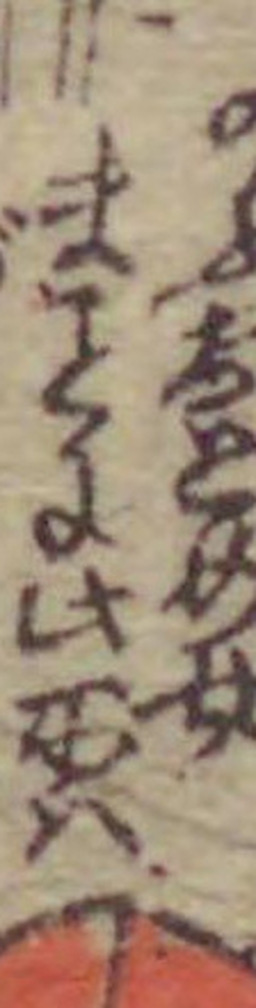まことに此所は
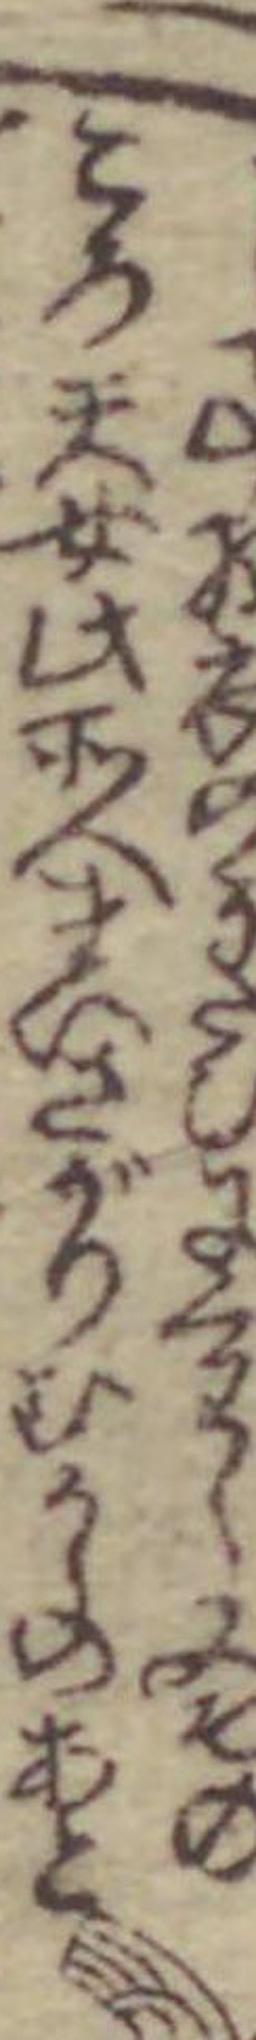ころ天女此所へまいさがりむかしのあと
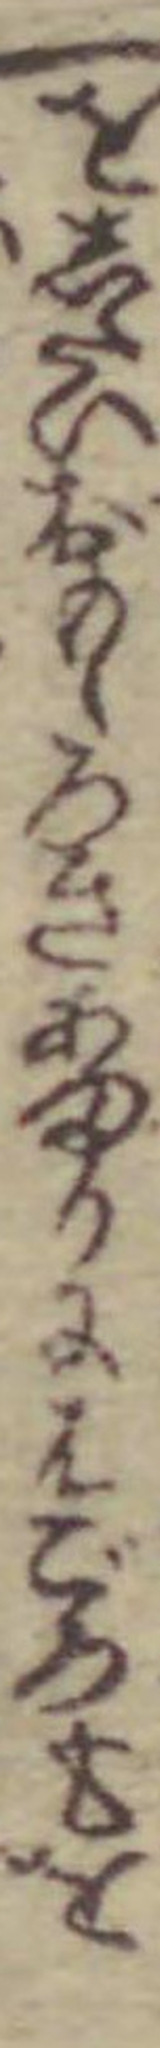をしたいおもしろきあまりにはごろもを
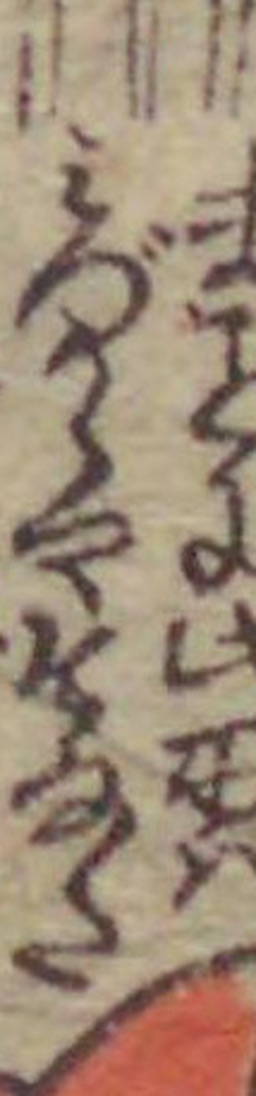みづからやそなた
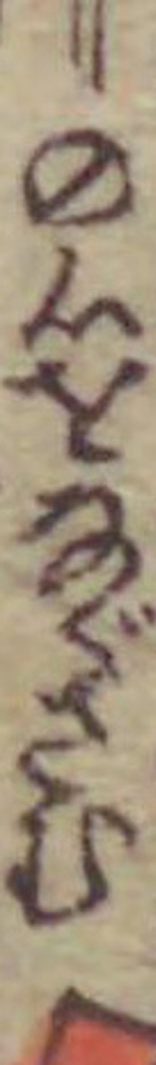の心をなぐさむ
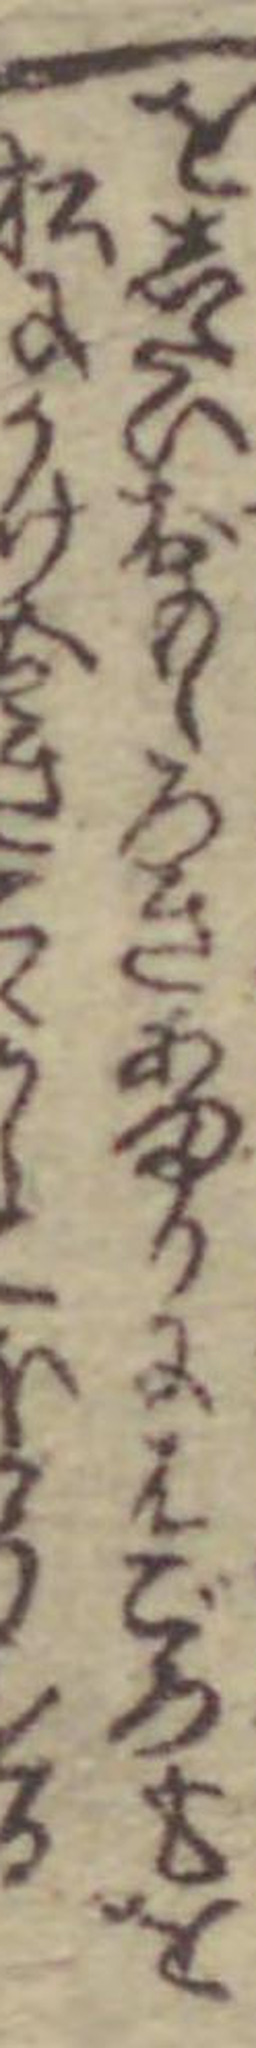松にかけおきこゝかしこほかうする
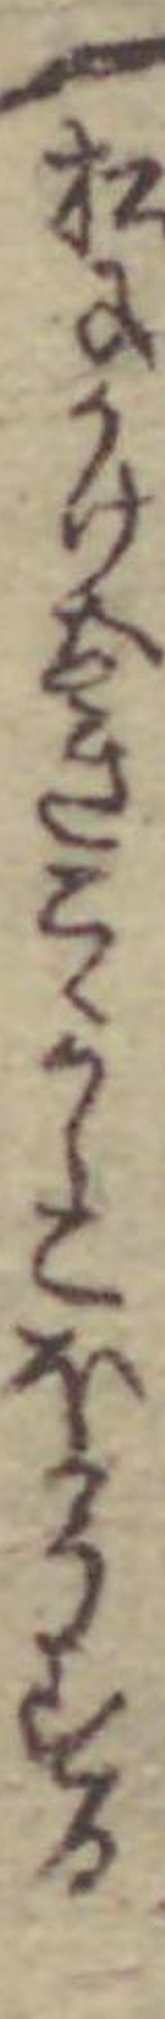松にかけおきこゝかしこほかうする
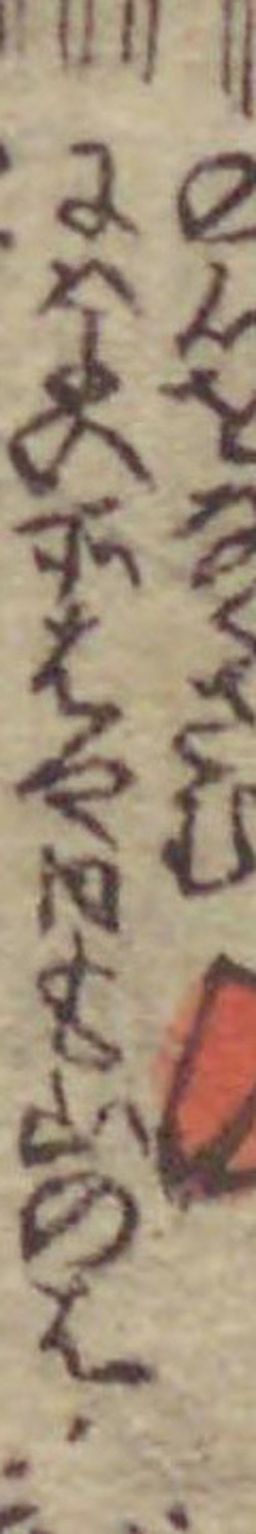にはよい所はや日も山のは
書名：娜二代鉢木 5巻
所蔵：国立国会図書館 National Diet Library, JAPAN
